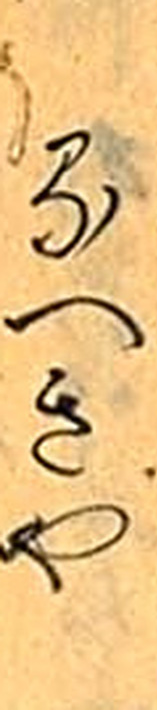るへきや
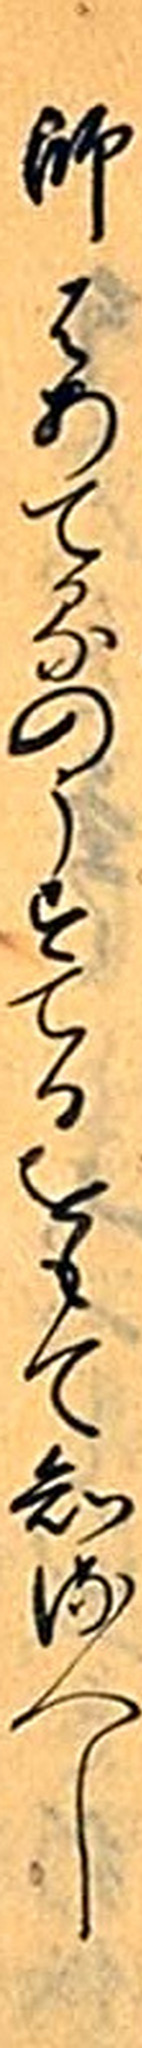師はあてるのうすてるをもて知るへし
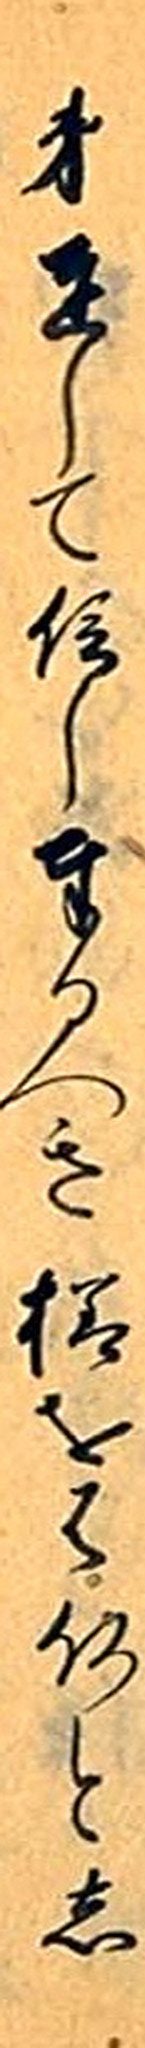弟達して信し奉るへき様をは何とし
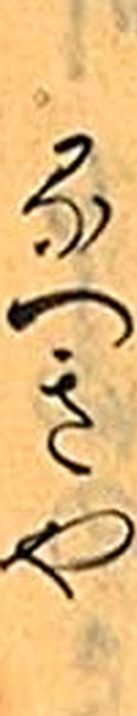るへきや
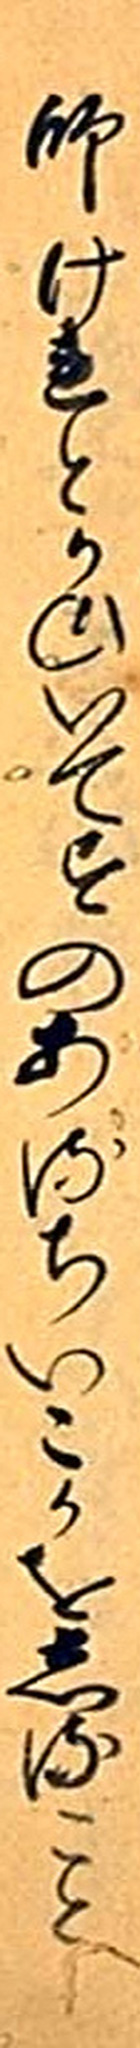師けれとかひいてすのあるちいこかをしること
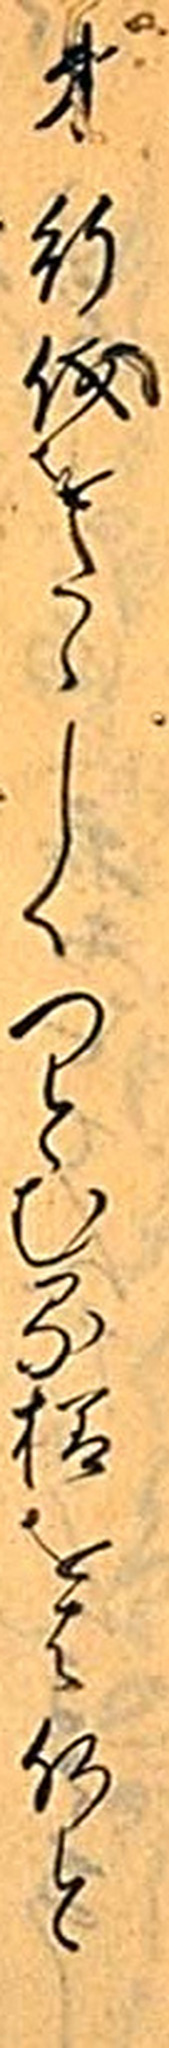弟行儀をたゝしくつとむる様をは何と
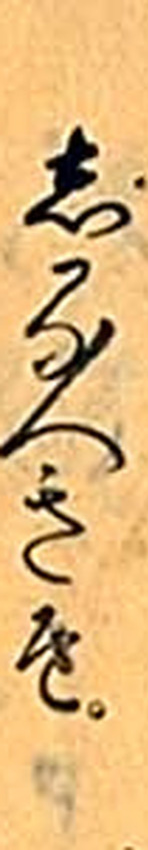しるへきそ
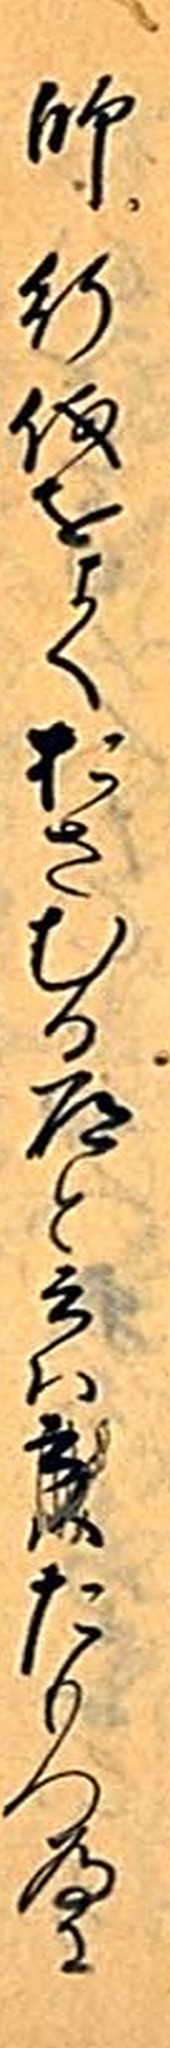師行儀をよくおさむる道と云は云はたもつ為に
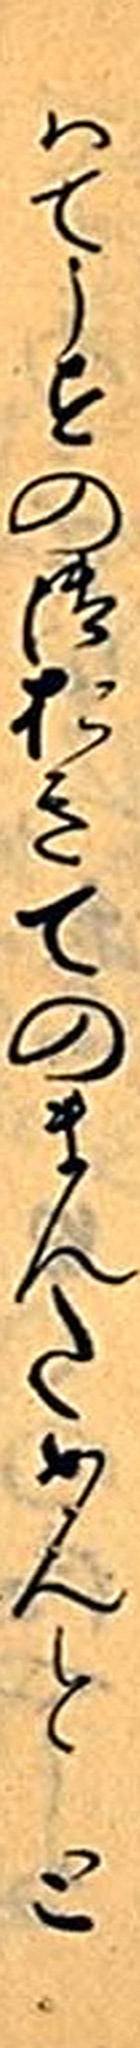はてうすの御おきてのまんためんとと
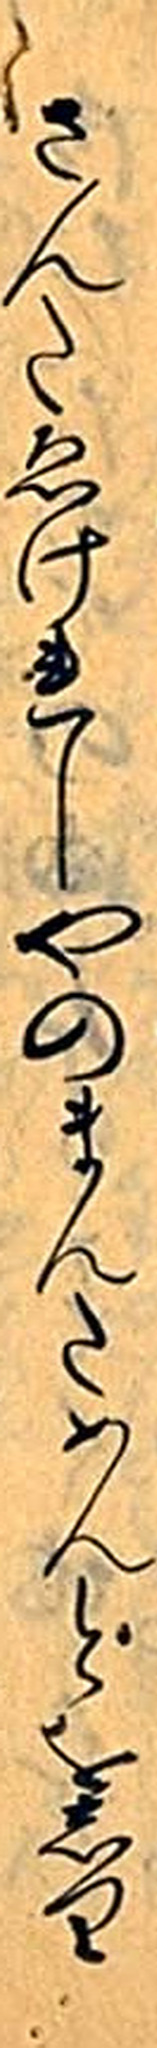さんたゑけれしやのまんためんとをしり
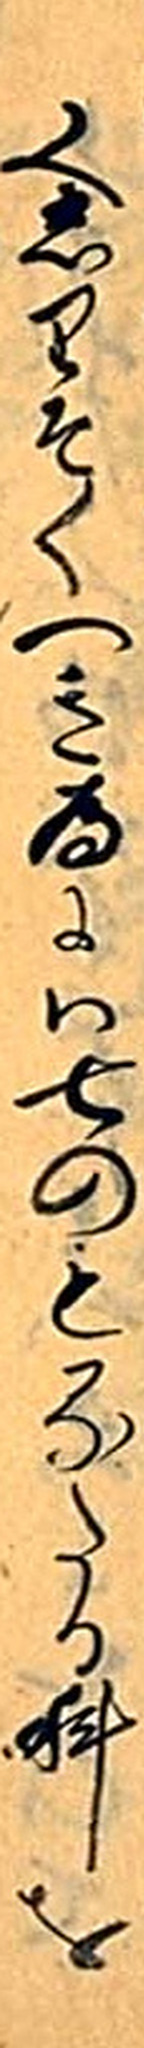又しりそくへき為には七のもるたる科を
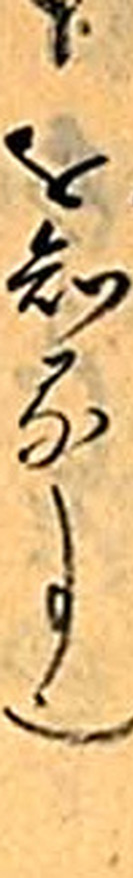を知る事也
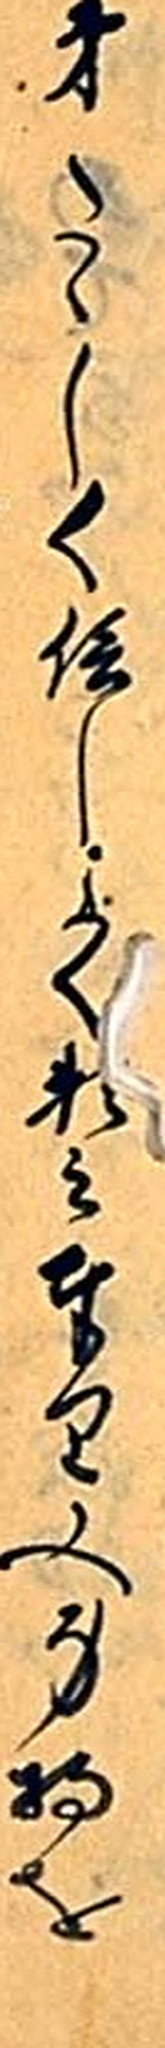弟たゝしく信しよく頼み奉り又身持を
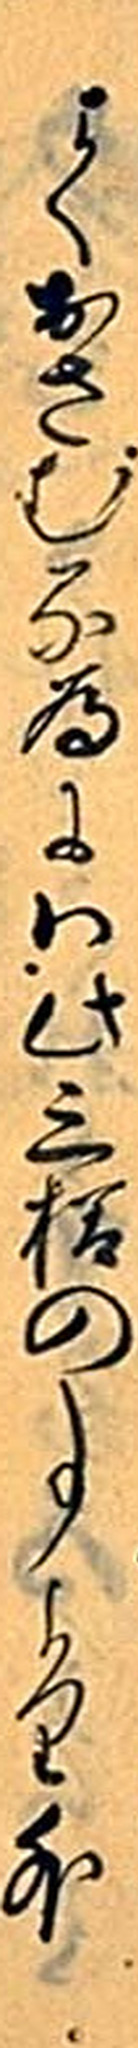よくおさむる為には此三様の事より外
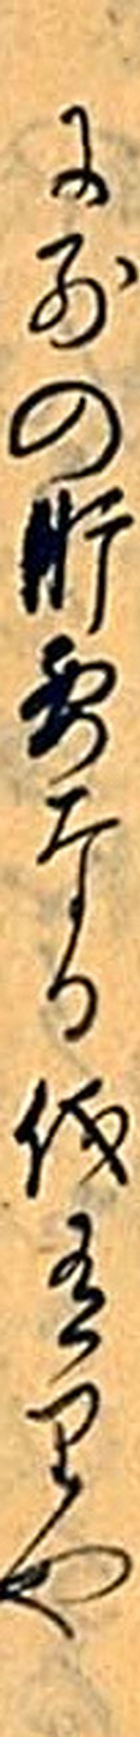に別の肝要なる儀有りや
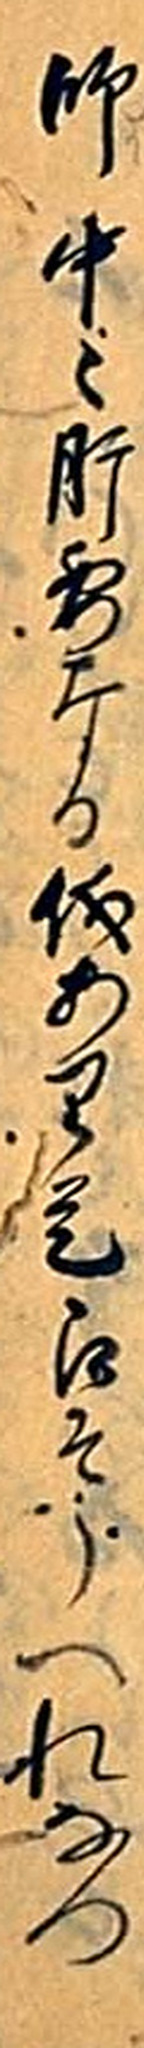師中々肝要なる儀あり是即そうへれなつ
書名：ドチリナ・キリシタン
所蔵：東京大学総合図書館 / General Library in the University of Tokyo
